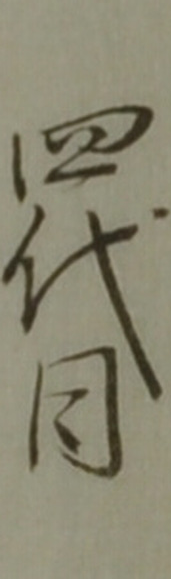四代目
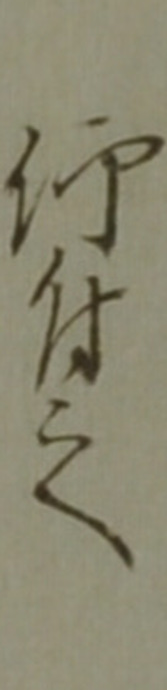仰付之
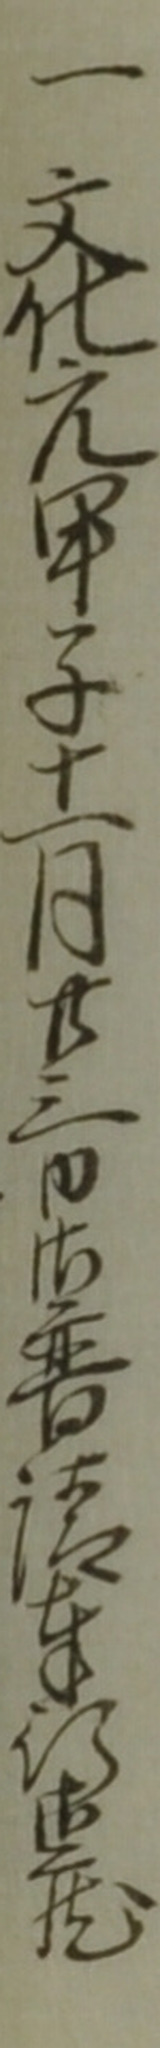一文化元甲子十一月廿三日御普請奉行御蔵
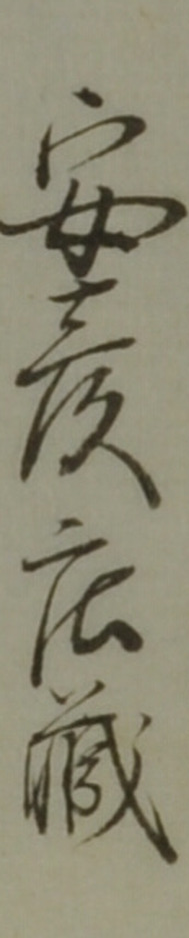安彦庄蔵
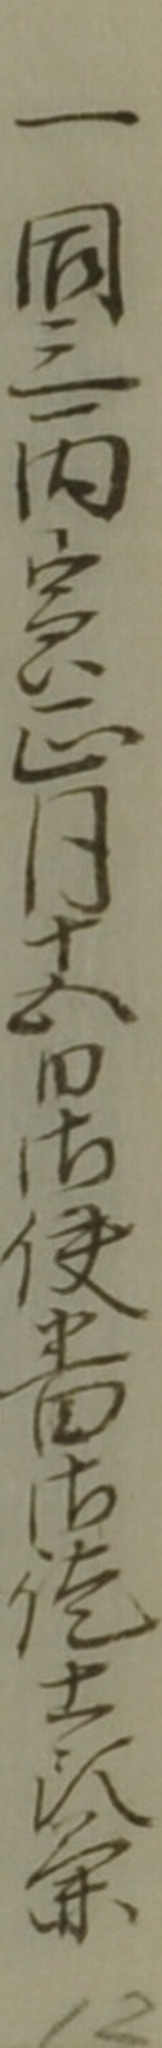一同三丙寅正月十五日御使番御徒士頭兼
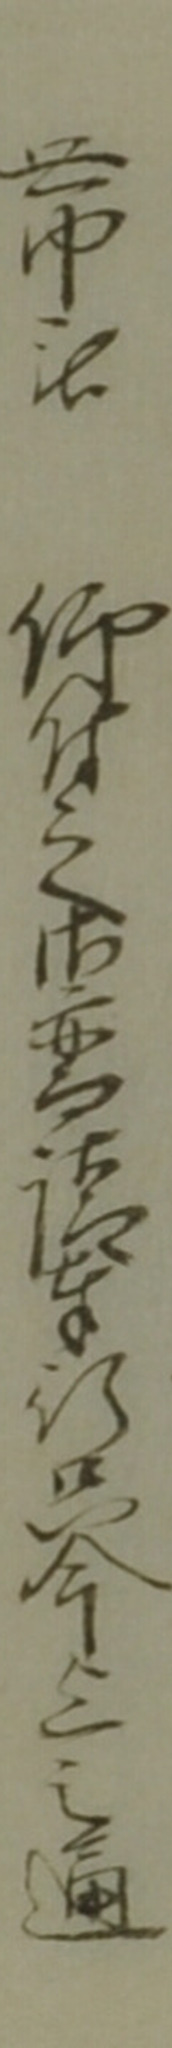帯被仰付之御普請奉行只今迄之通
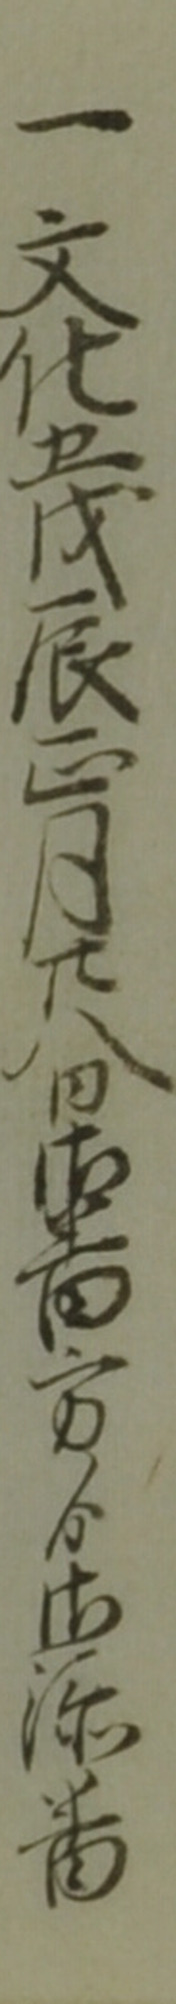一文化五戊辰正月廿八日御番方より御添番
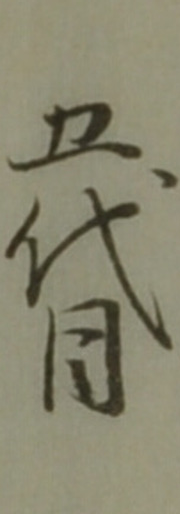五代目
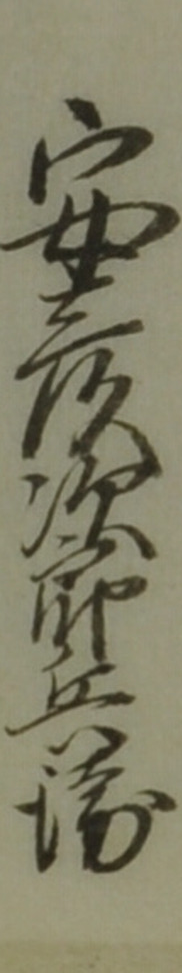安彦次郎兵衛
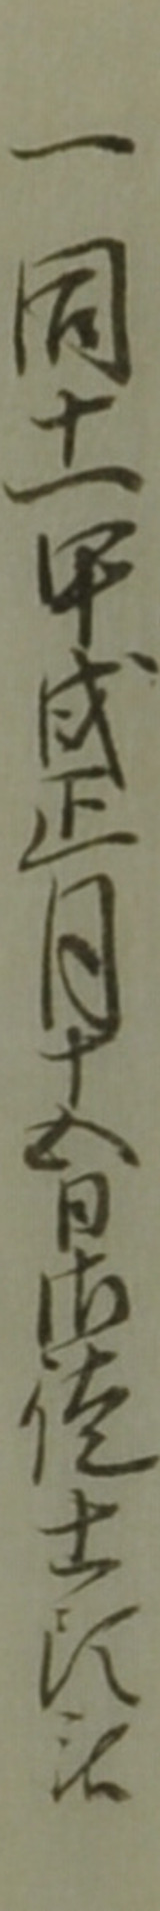一同十一甲戌正月十五日御徒士頭被
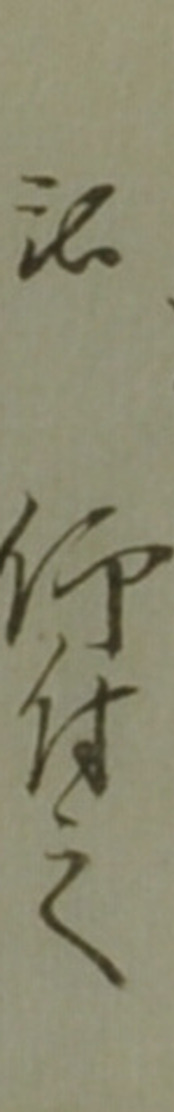被仰付之
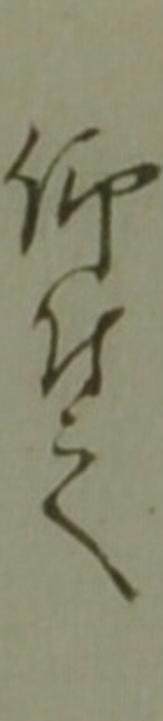仰付之
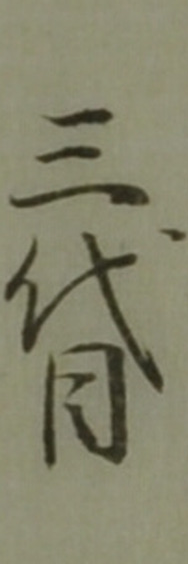三代目
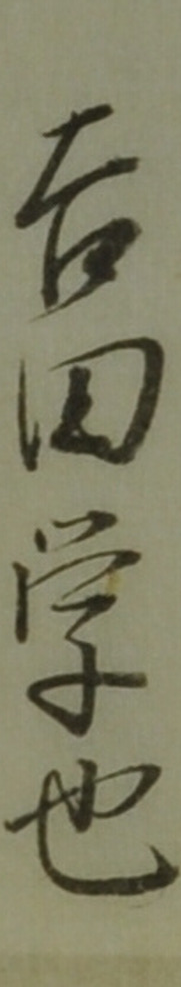吉田学也
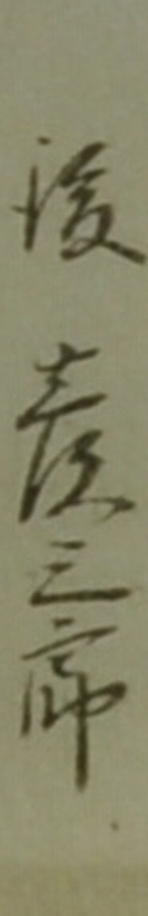後彦三郎
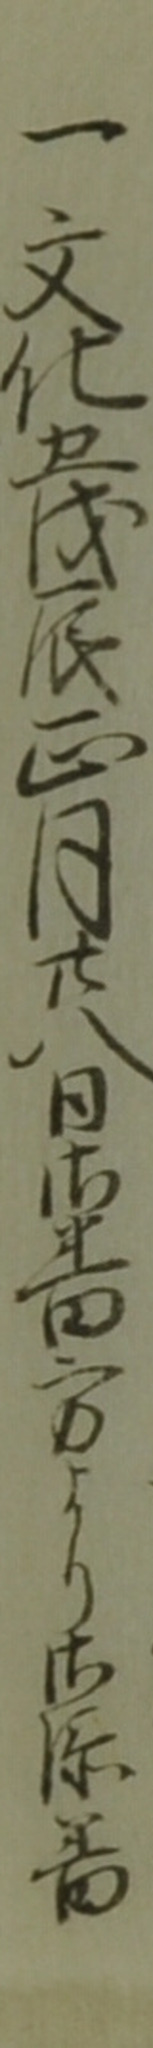一文化五戊辰正月廿八日御番方より御添番
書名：諸御役代々録（八）
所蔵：伊那市立高遠町図書館・合同会社AMANE
